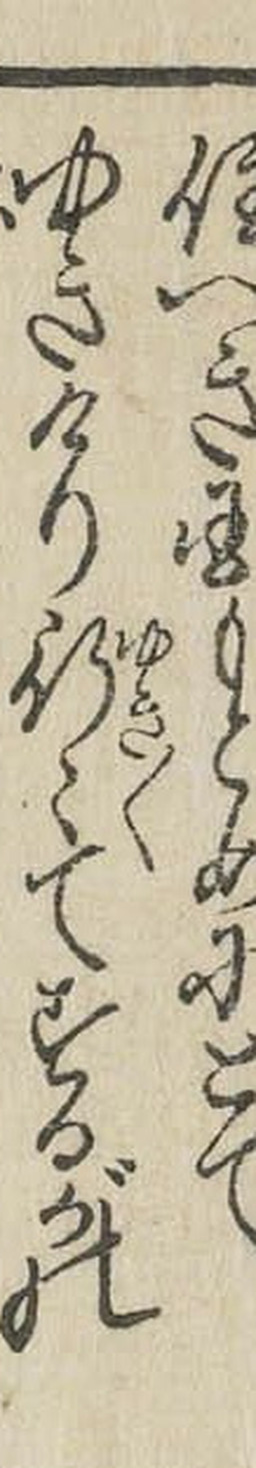ゆきけり行々てするがの
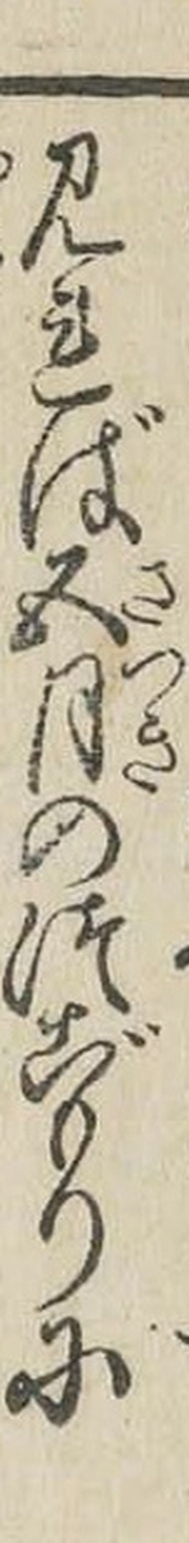見れば五月のつごもりに
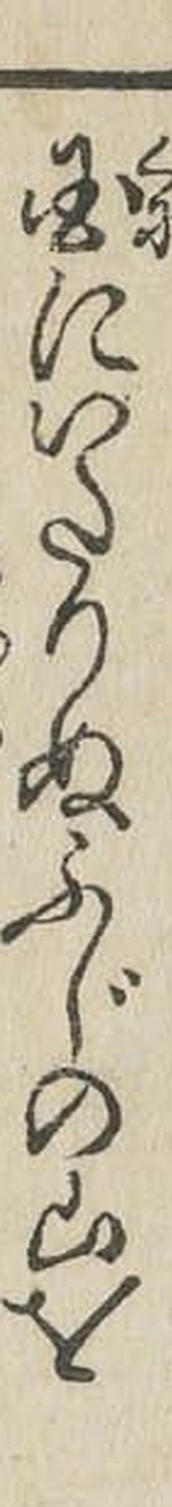国にいたりぬふじの山を
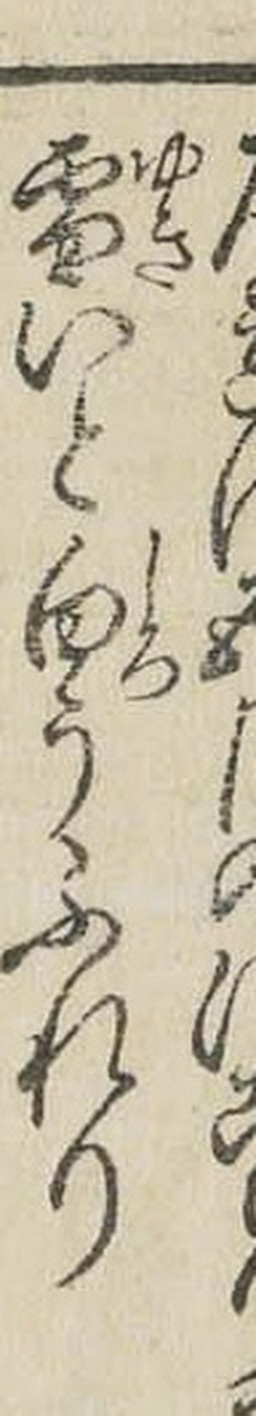雪いと白うふれり
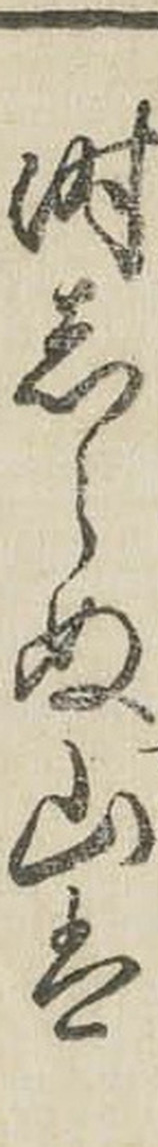時しらぬ山は
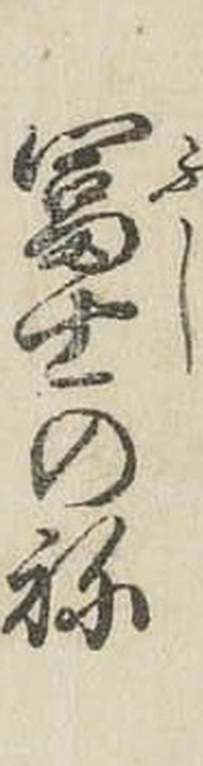富士のね
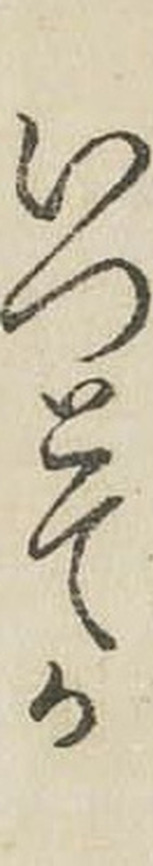いつとてか
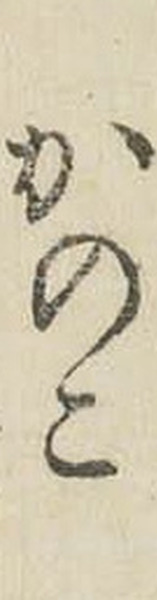かのこ
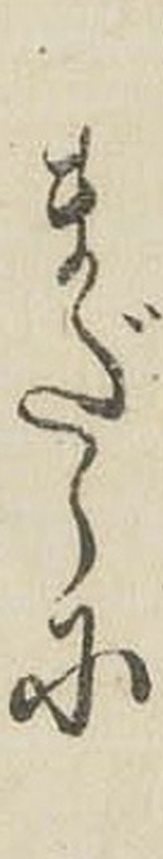まだらに
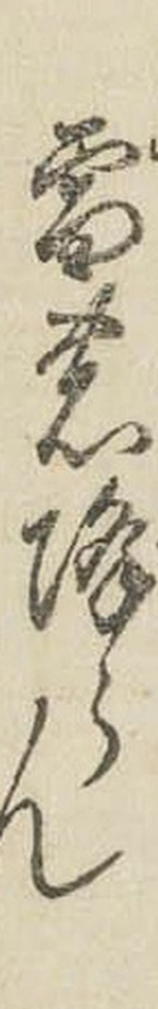雪の降らん
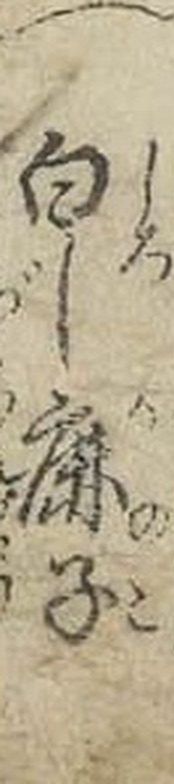白し鹿子
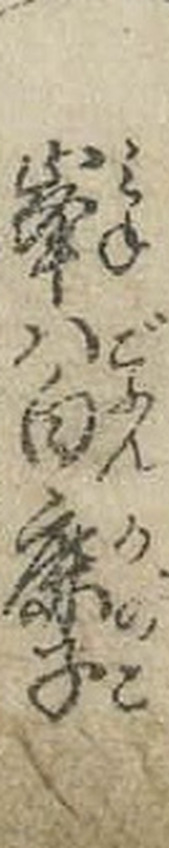峯は白鹿子
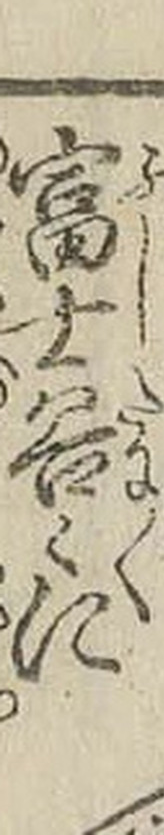富士谷々に
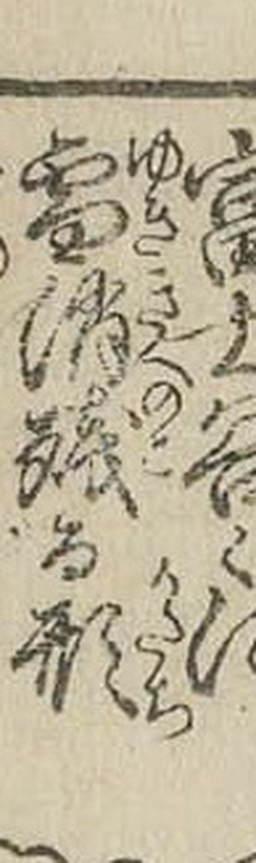雪消残る形
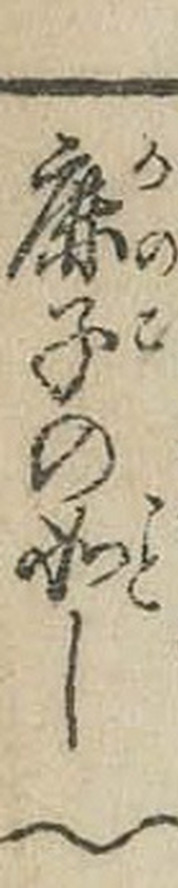鹿子の如し
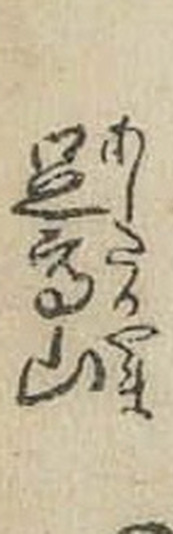足高山
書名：絵本写宝袋 9巻 1之巻
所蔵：東京学芸大学教育コンテンツアーカイブ
